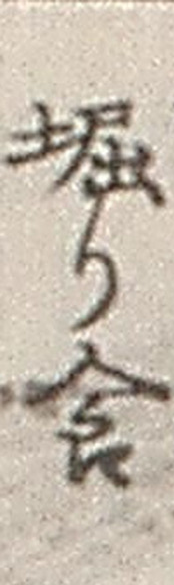堀り食
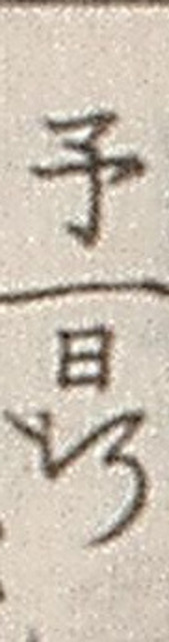予一日行
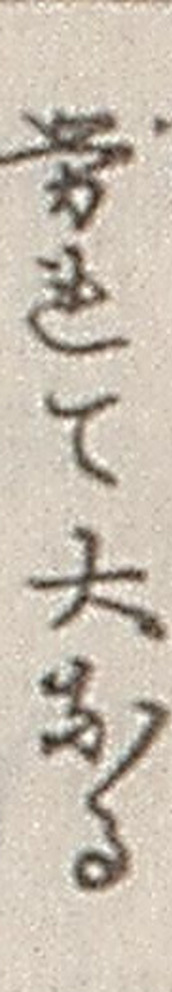労れて大なる
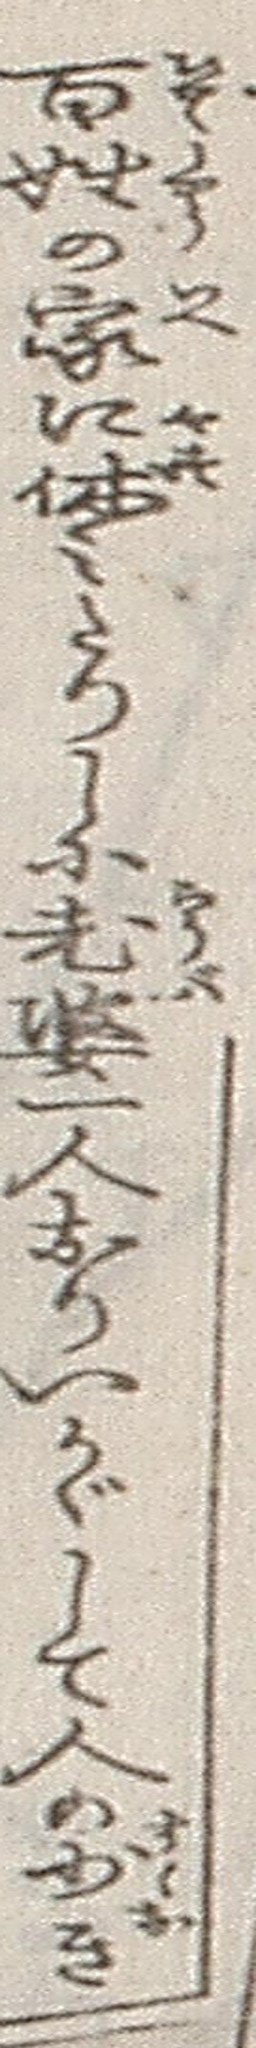百姓の家に休みたりしに老婆一人なりいかゞして人の少き
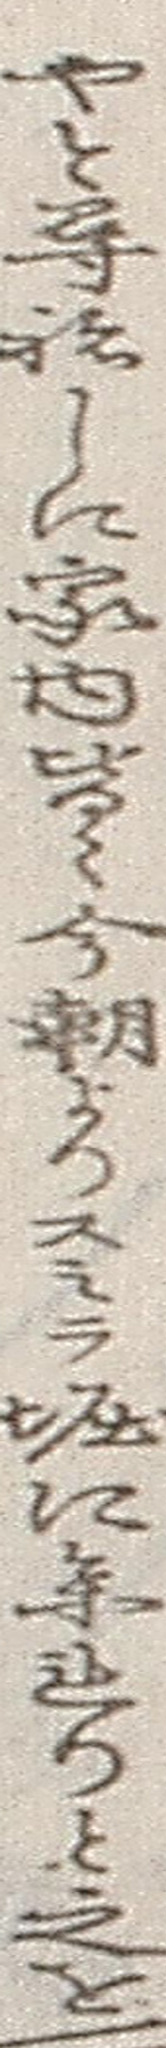やと尋ねしに家内皆〻今朝よりスミラ堀に参れりと之を
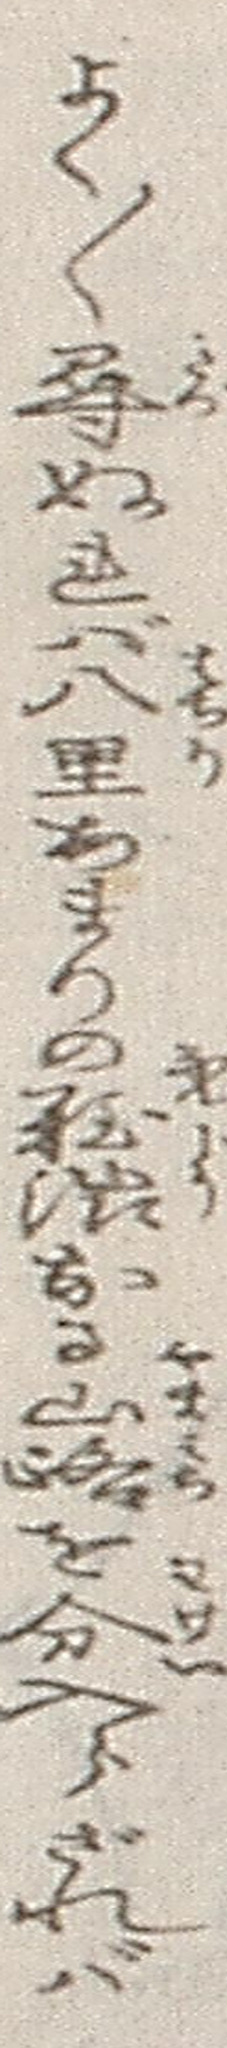よく〳〵尋ぬれば八里あまりの難渋なる山路を分入らざれば
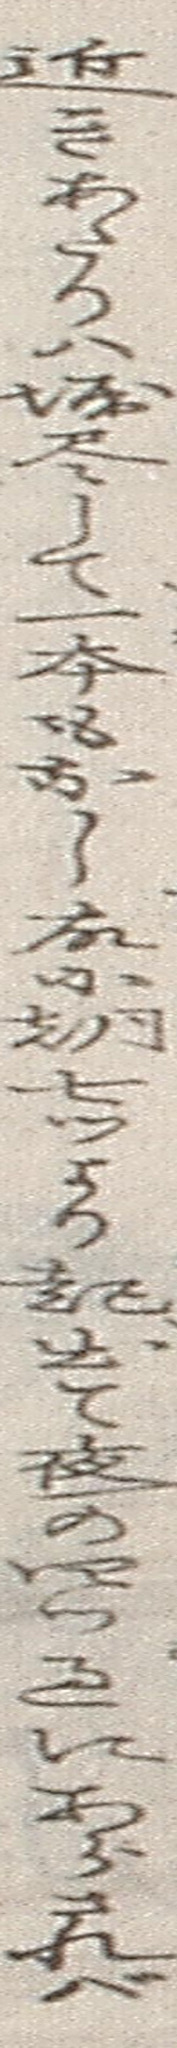近きあたりは堀尽して一本もなし故に朝七ツより起出て夜の四ツ過にあらされば
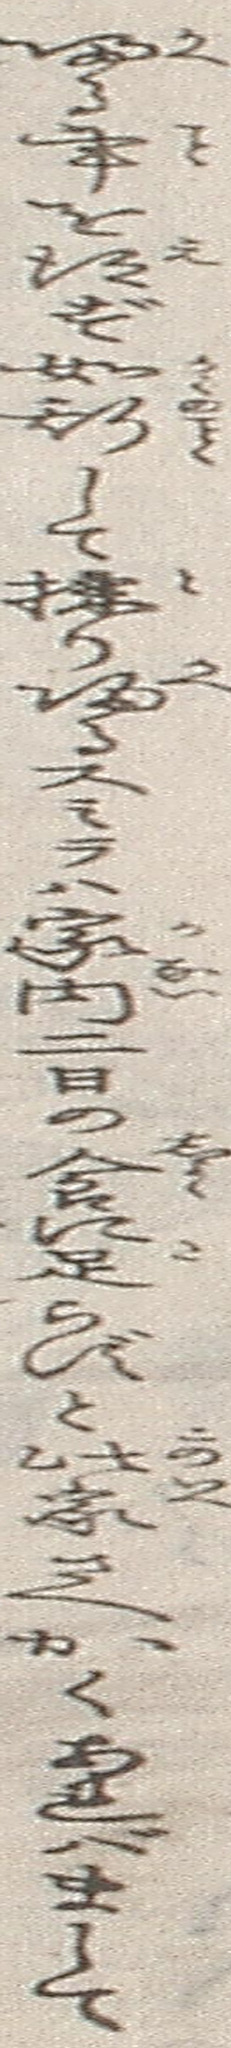帰る事を得ず如斯して採り帰るスミラは家内二日の食に足らずと此家さへかくあればまして
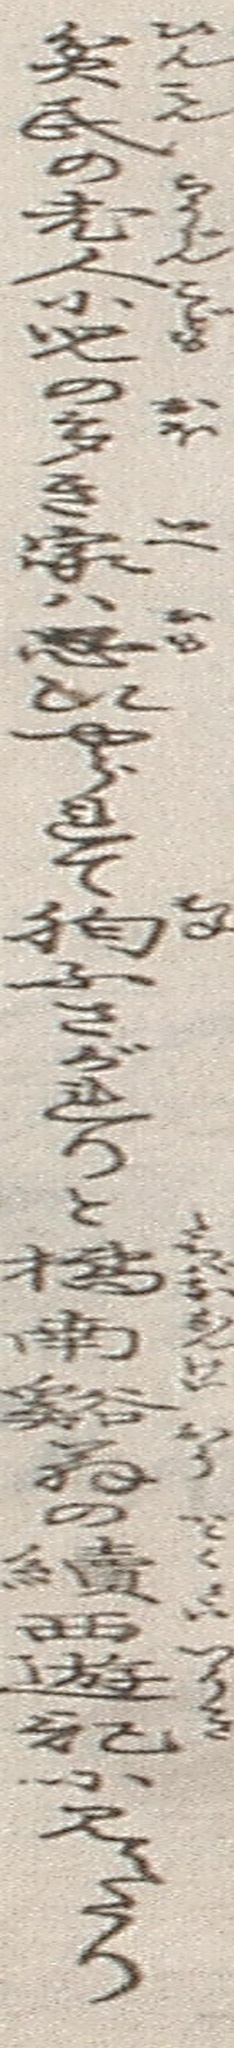貧民の老人小児の多き家は思ひやられて胸ふさがれりと橘南谿翁の続西遊記に見えたり

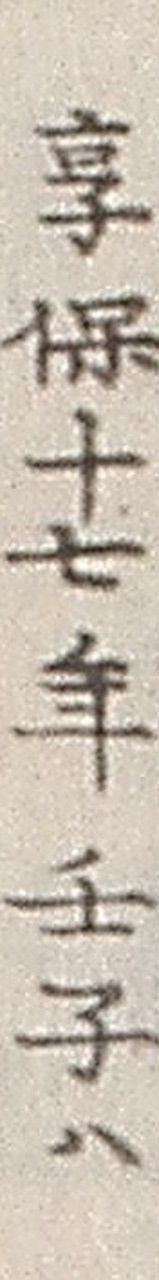享保十七年壬子は
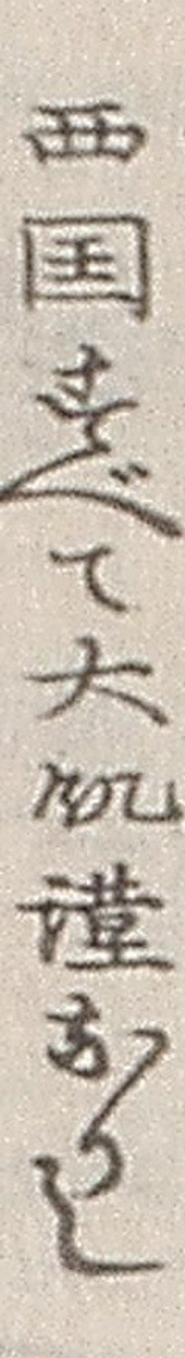西国すべて大飢饉なりし
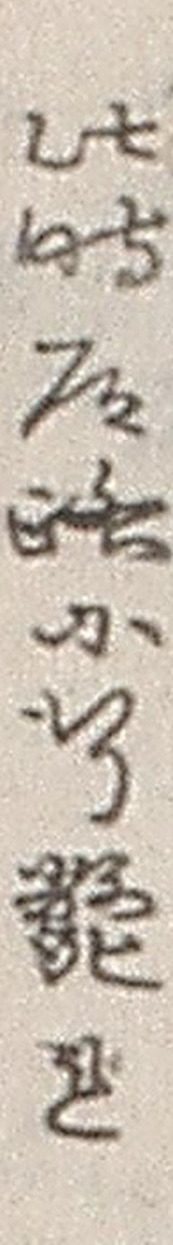此時道路に行斃れ
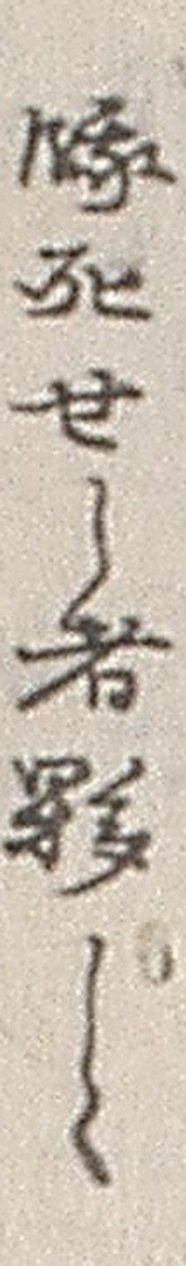餓死せし者夥しく
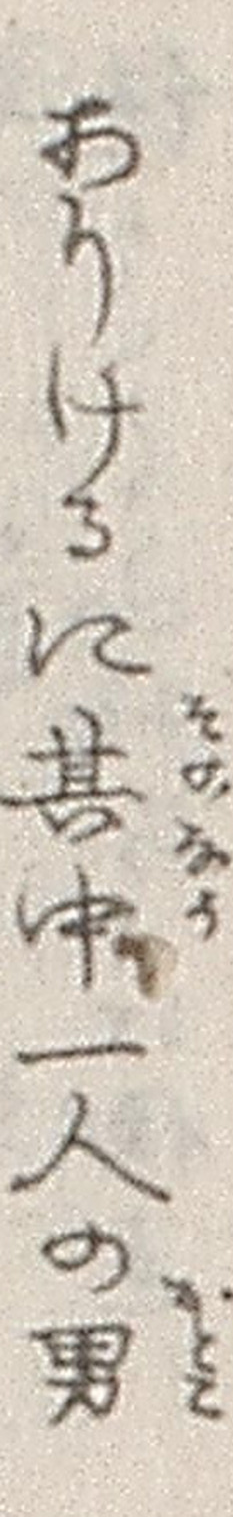ありけるに其中一人の男
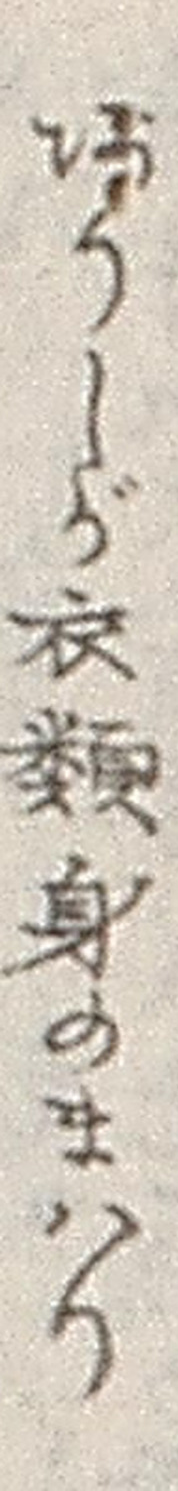ありしが衣類身のまはり
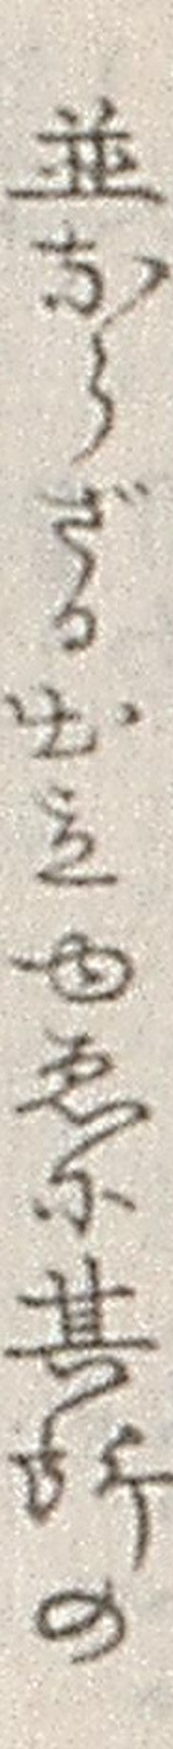並ならざる出立ゆゑに其所の
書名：凶荒図録　完
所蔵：東京大学地震研究所図書室 Earthquake Research Institute Library, The University of Tokyo, JAPAN
